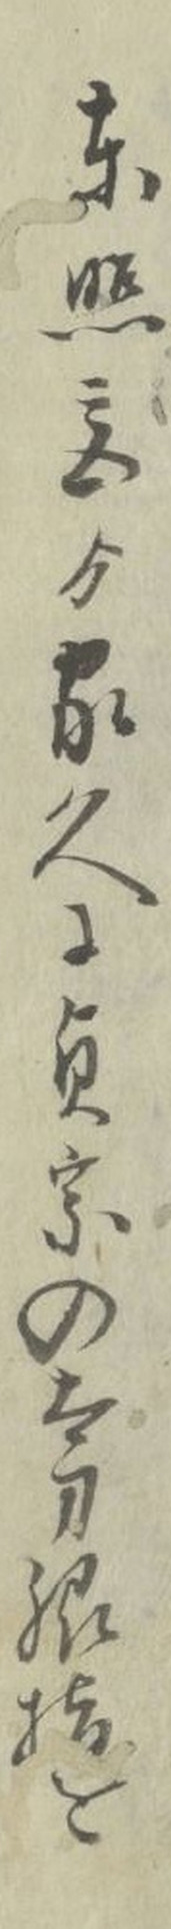東照宮ゟ家久に貞宗の太刀脇指を
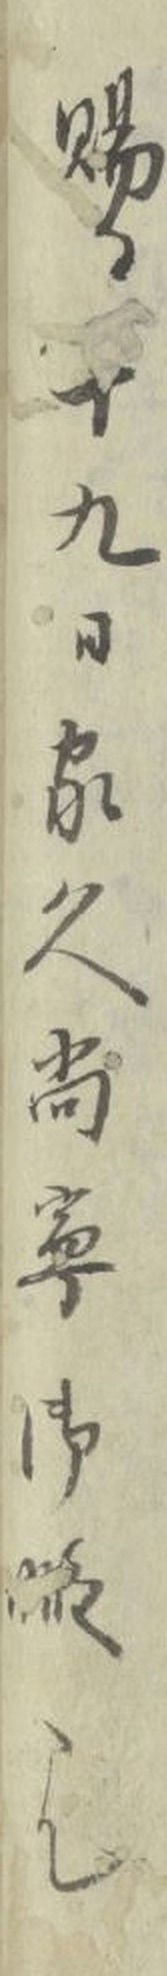賜る十九日家久尚寧御暇候て
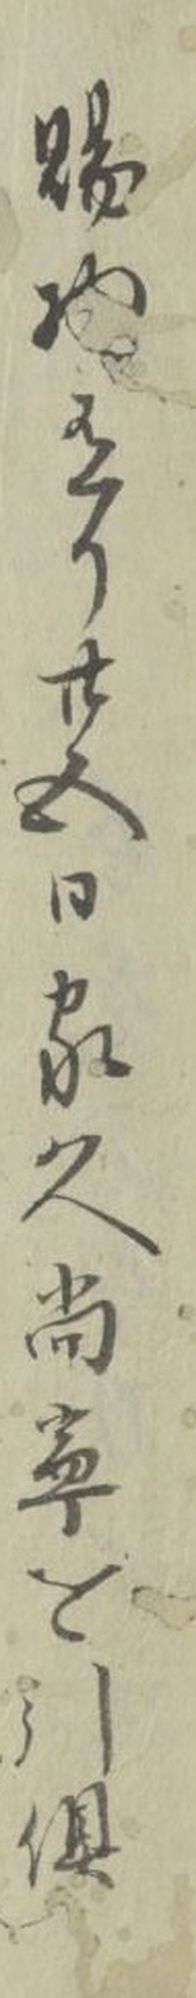賜物有り廿五日家久尚寧を引倶
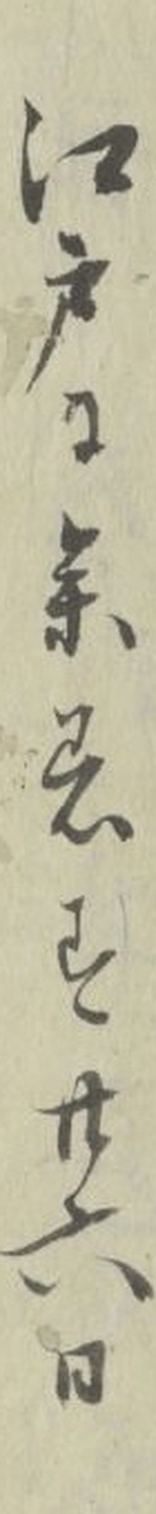江戸に参着す廿六日
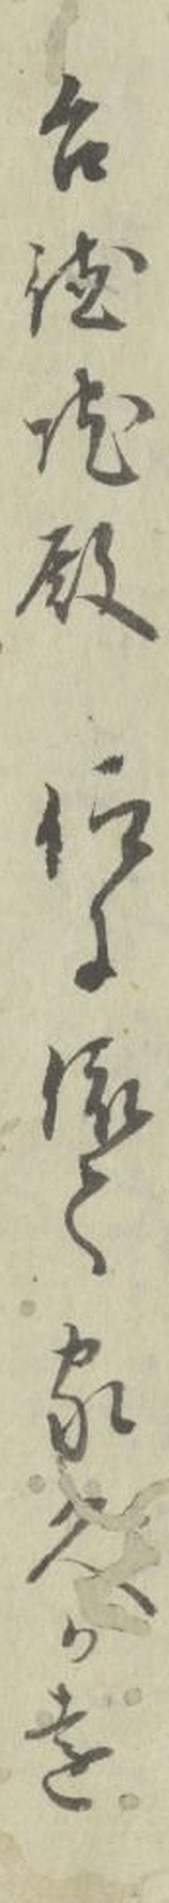台徳院殿仰に依て家久か遠
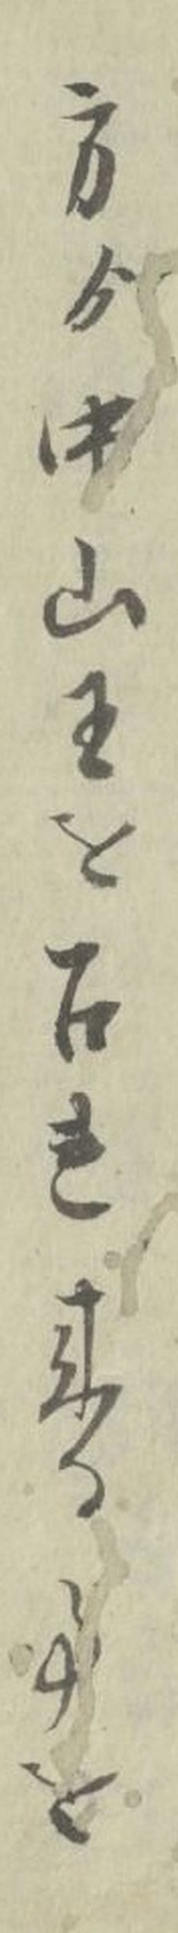方ゟ中山王を召連来る事を
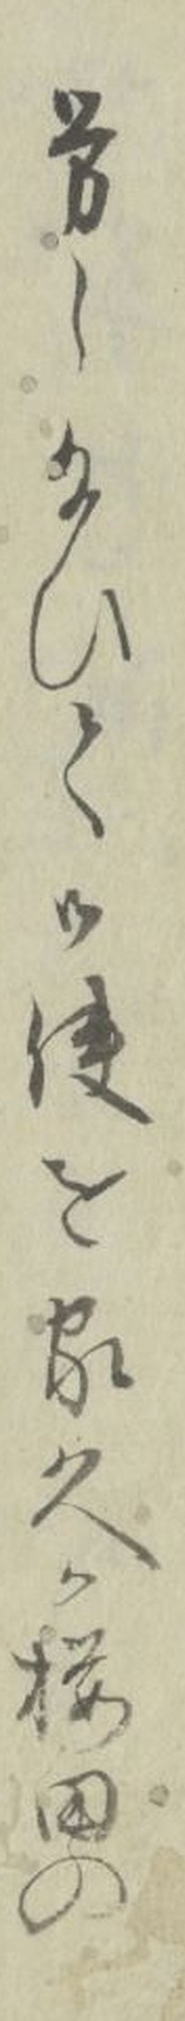労し給ひて御使を家久か桜田の
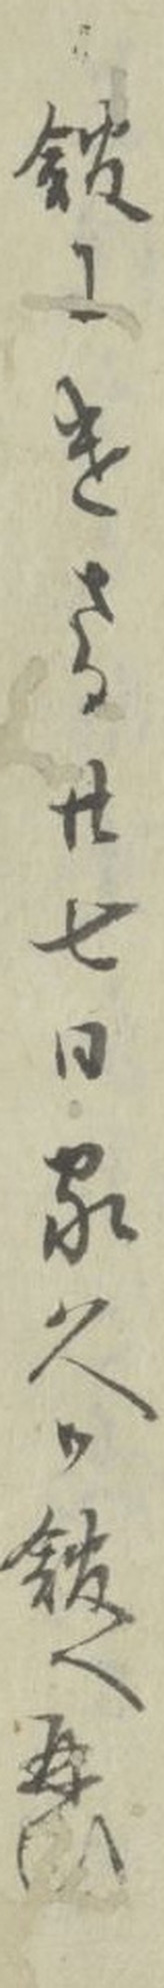館に遣さる廿七日家久か館へ再ひ

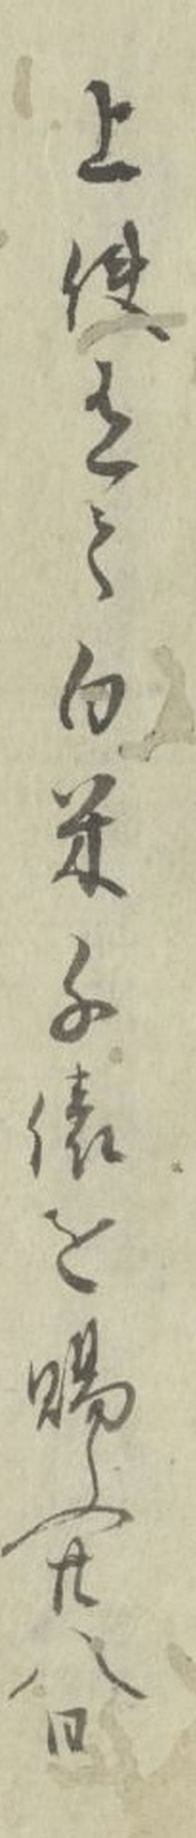上使有て白米千俵を賜ふ廿八日
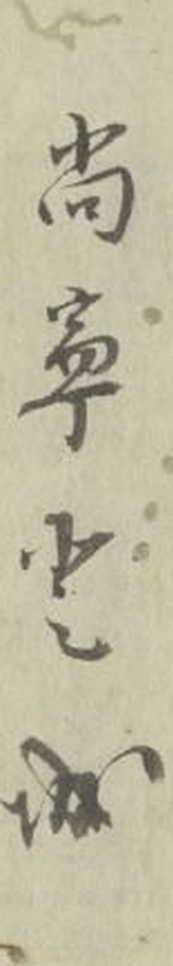尚寧登城
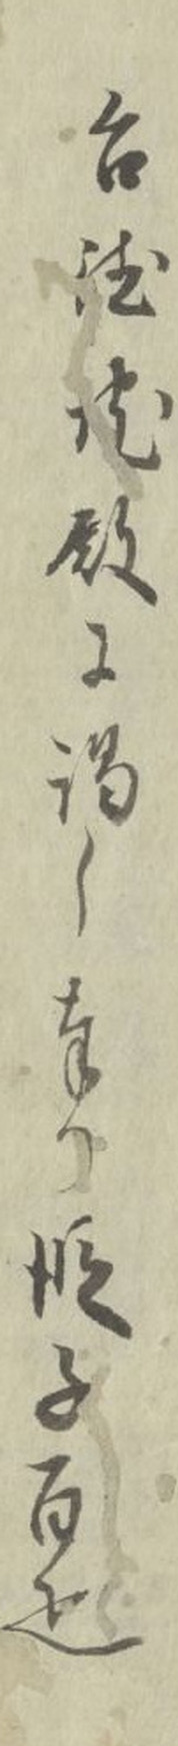台徳院殿に謁し奉り段子百疋
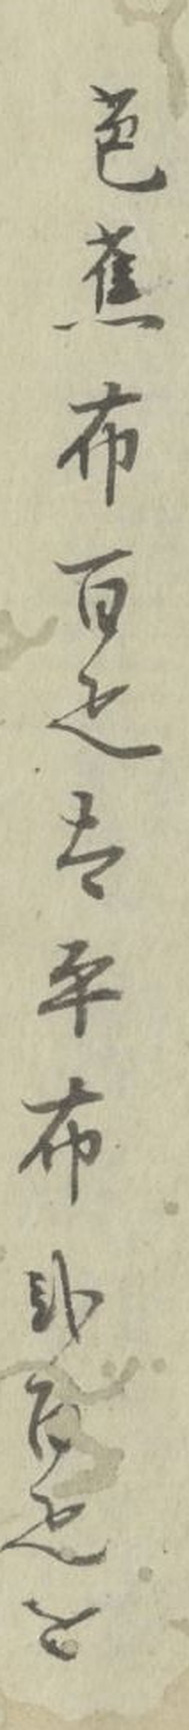芭蕉布百疋太平布弐百疋を
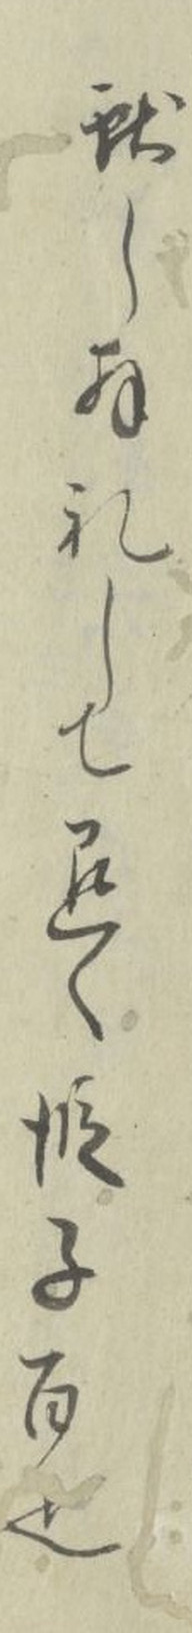献し拝礼して退く段子百疋
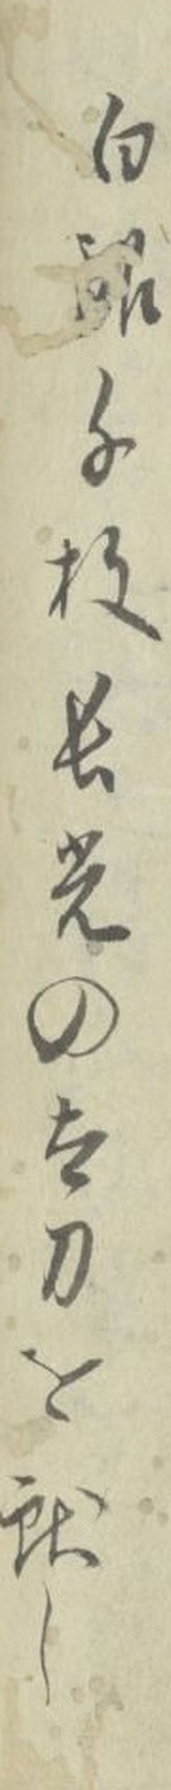白銀千枚長光の太刀を献し
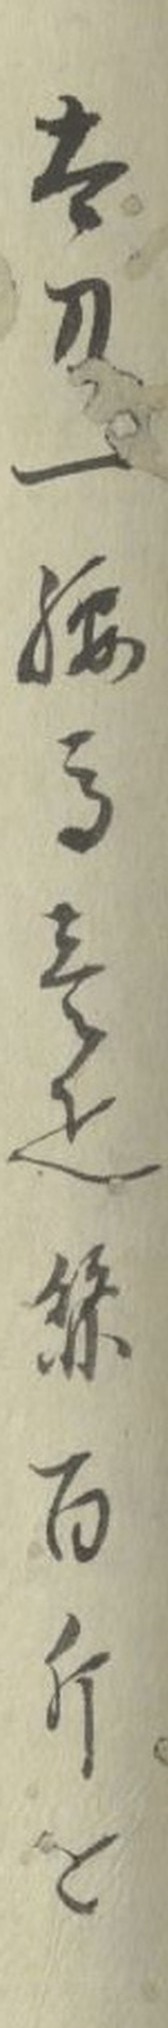太刀一腰馬壱疋絲百斤を
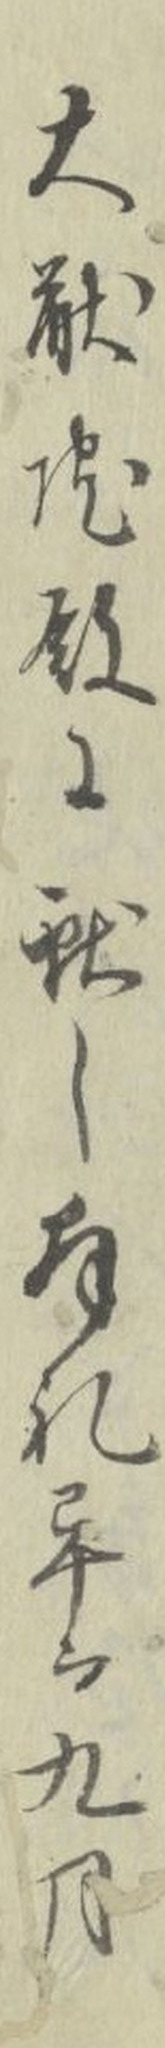大猷院殿に献し拝礼畢而九月
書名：琉球来朝記 自一至七
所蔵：University of the Ryukyus Library
